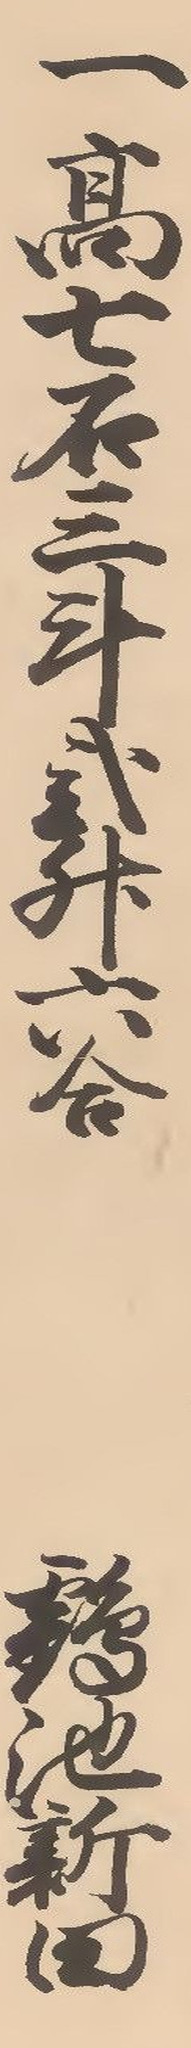一高七石三斗弐升六合鶴池新田
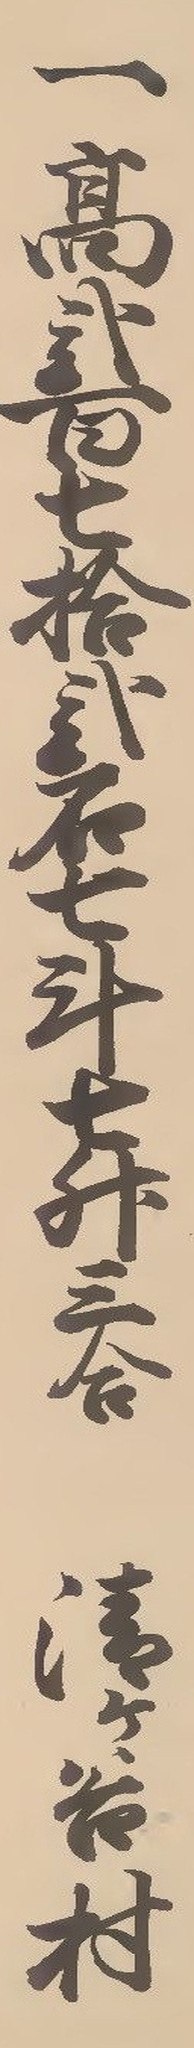一高弐百七拾弐石七斗七升三合清ヶ谷村
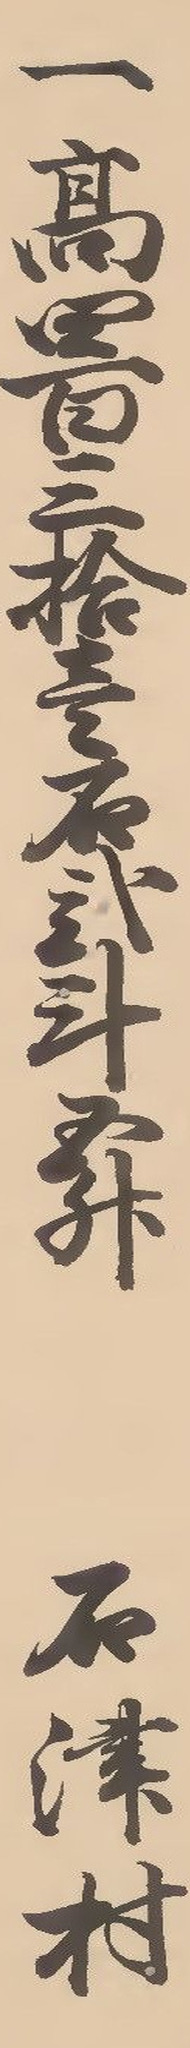一高四百三拾壱石弐斗五升石津村
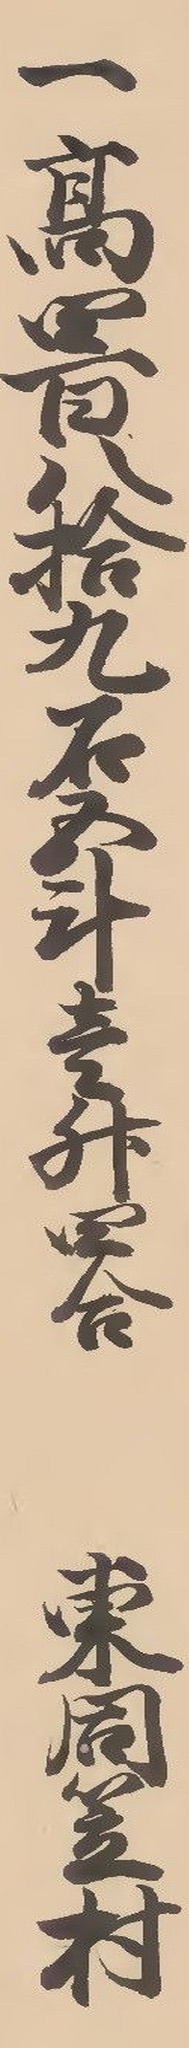一高四百八拾九石五斗壱升四合東同笠村
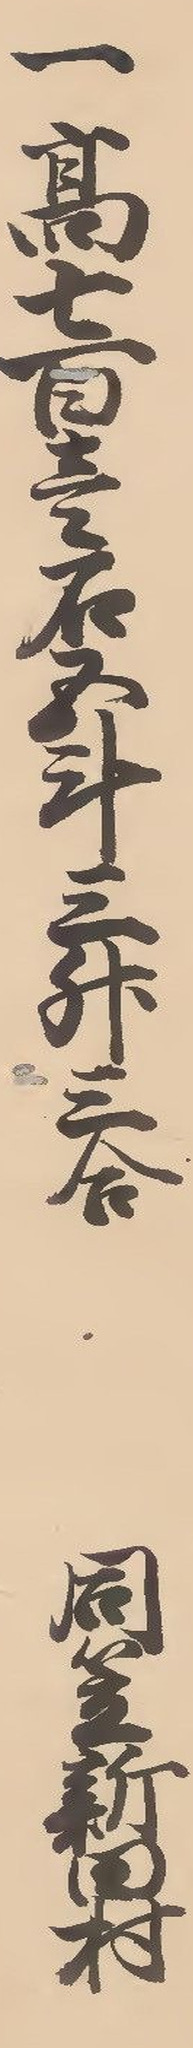一高七百壱石五斗三升三合同笠新田村

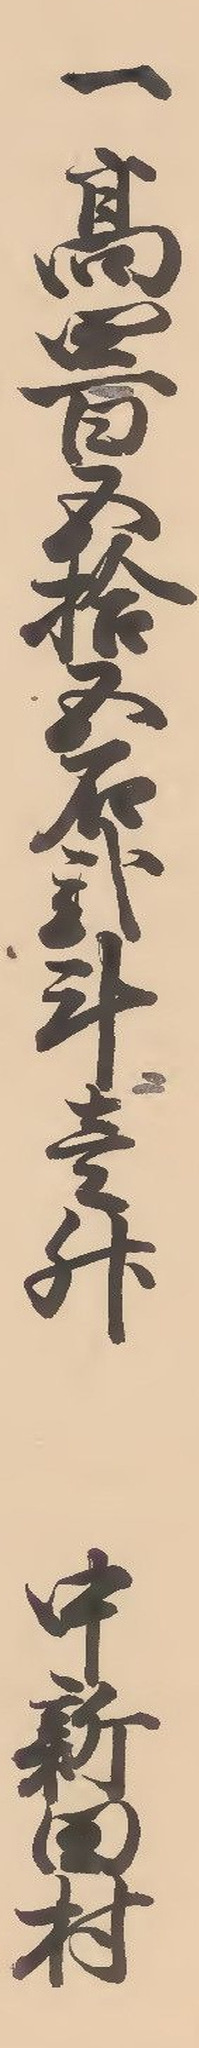一高四百五拾五石弐斗壱升中新田村
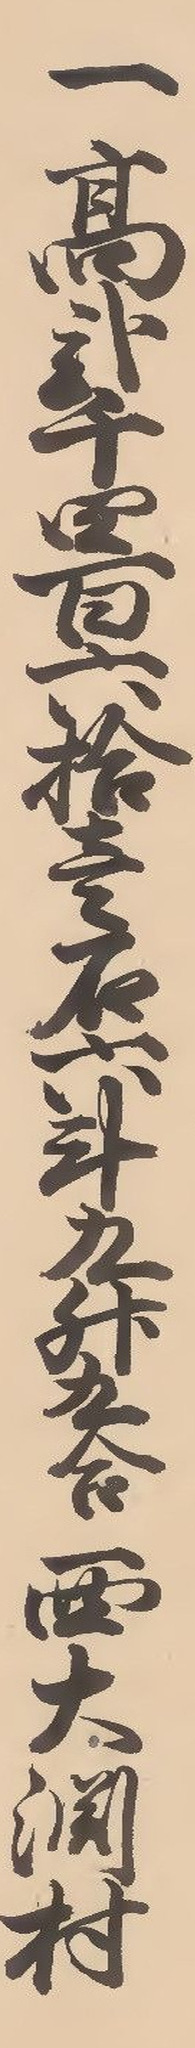一高弐千四百六拾壱石六斗九升九合西大渕村
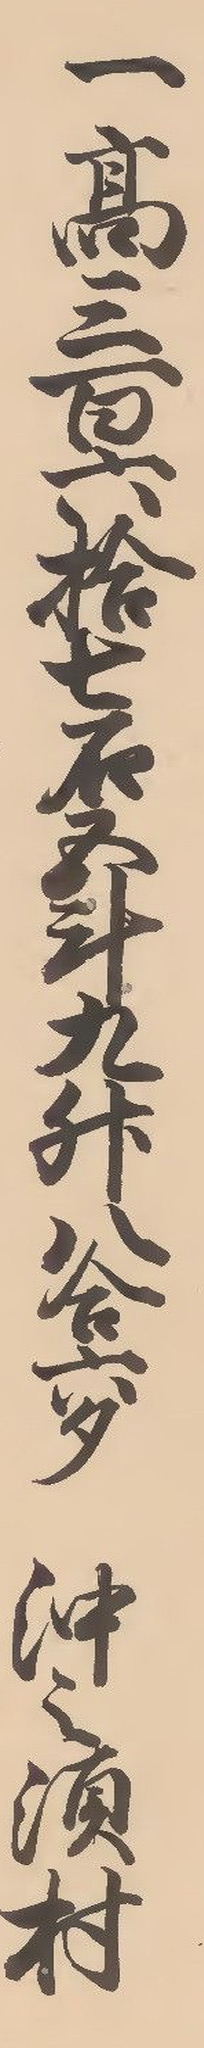一高三百六拾七石五斗九升八合六勺沖之須村
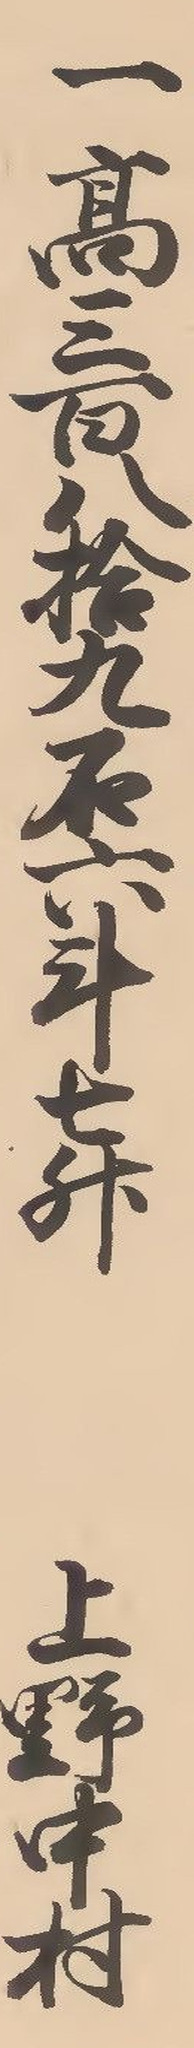一高三百八拾九石六斗七升上野中村
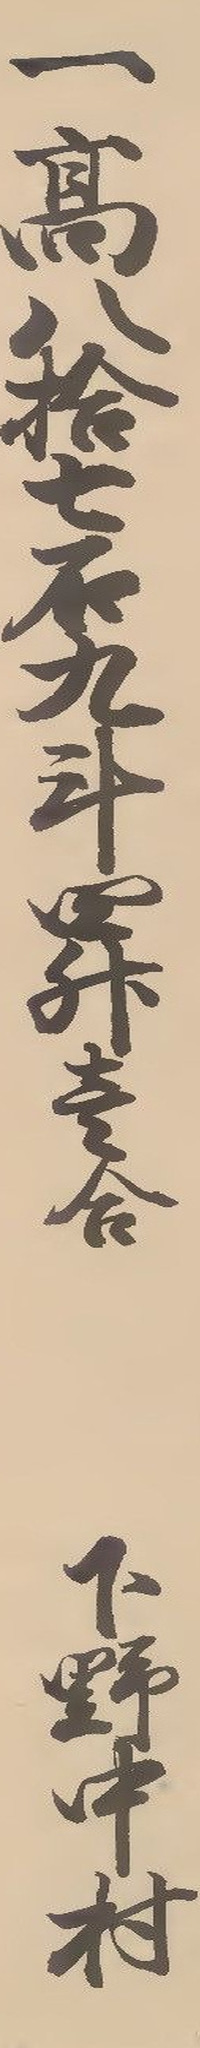一高八拾七石九斗四升壱合下野中村
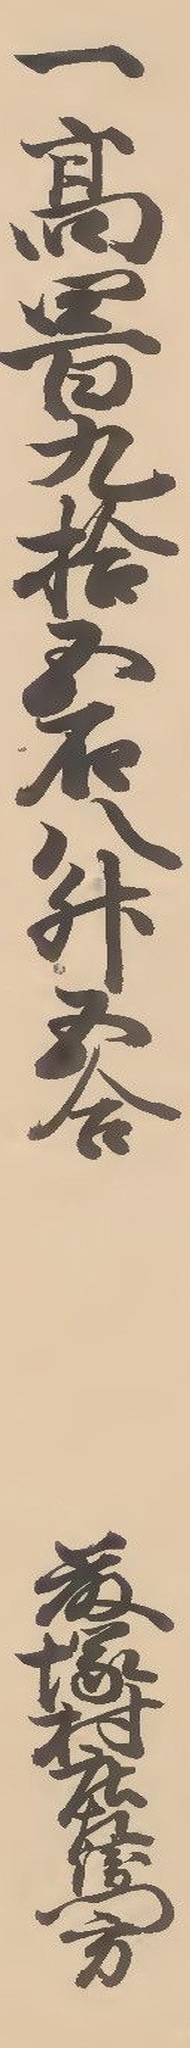一高四百九拾五石八升五合藤塚村庄左衛門方
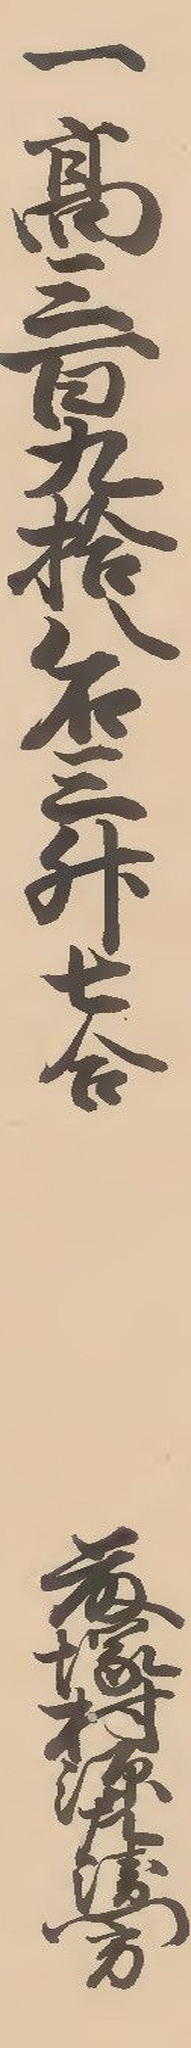一高三百九拾八石三升七合藤塚村源左衛門方
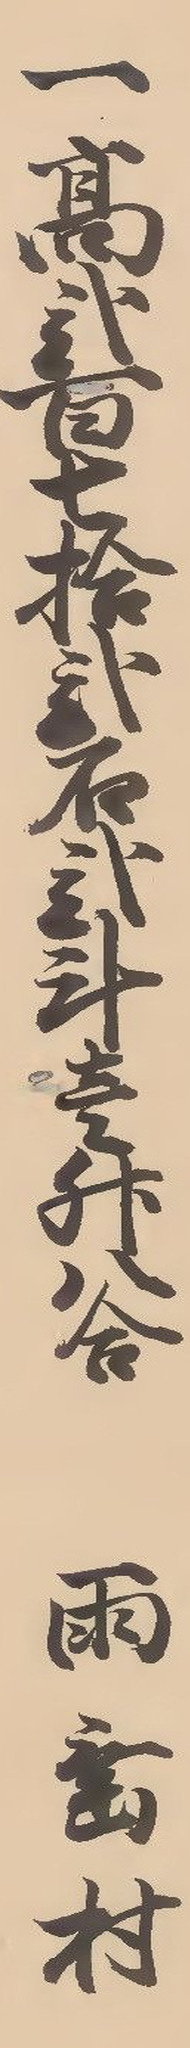一高弐百七拾弐石弐斗壱升八合雨垂村

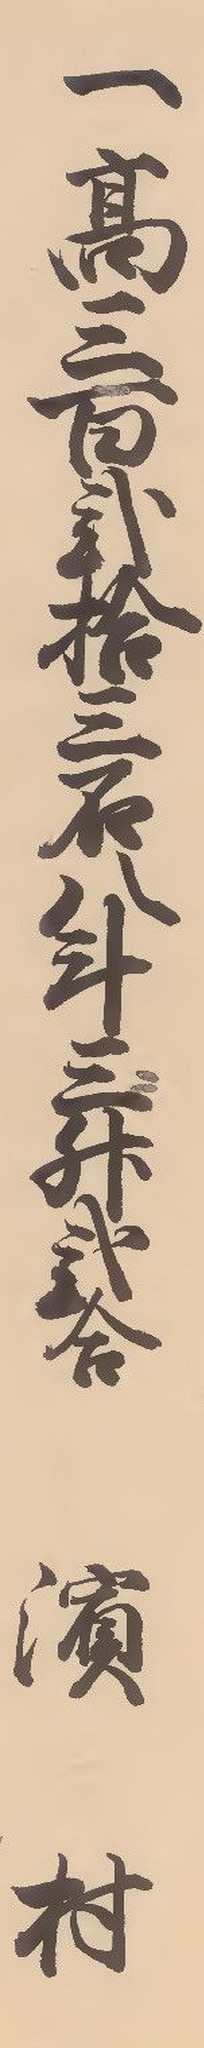一高三百弐拾三石八斗三升弐合浜村
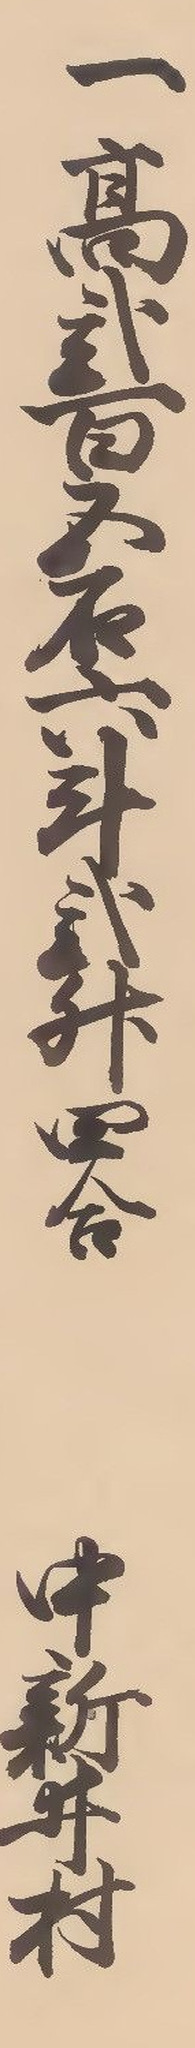一高弐百五石六斗弐升四合中新井村
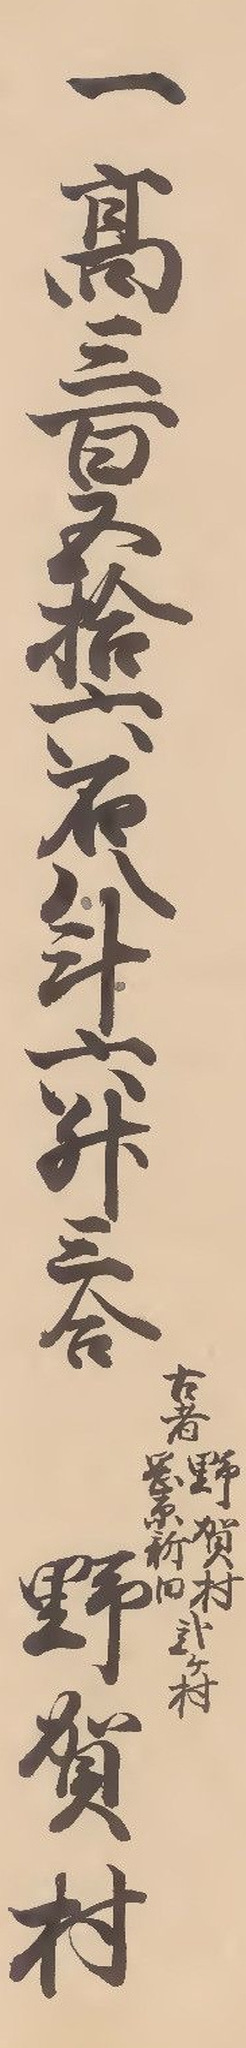一高三百弐拾三石八斗三升弐合浜村
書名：遠江国郷帳
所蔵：国立公文書館 National Archives of Japan
